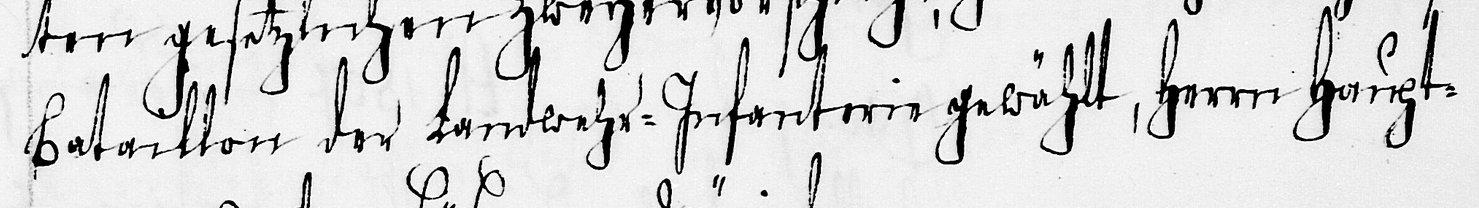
Bataillon der Landwehr-Infanterie gewählt, Herrn Haupt¬
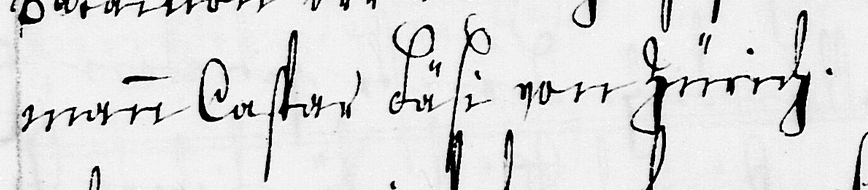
mann Caspar Fäsi von Zürich.
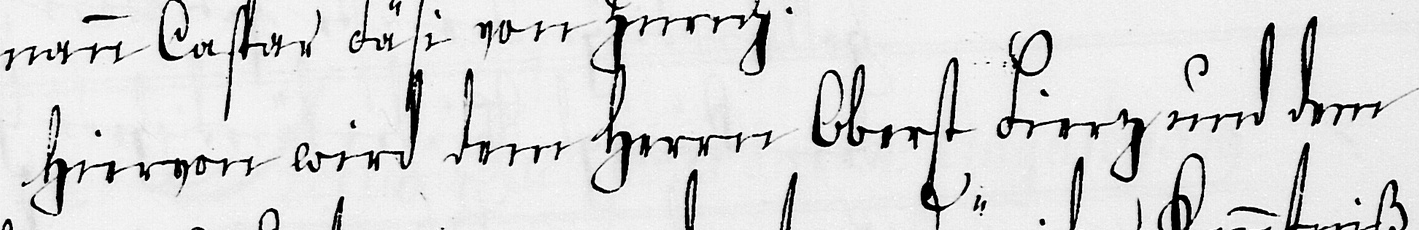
Hiervon wird dem Herrn Oberst Fierz und dem
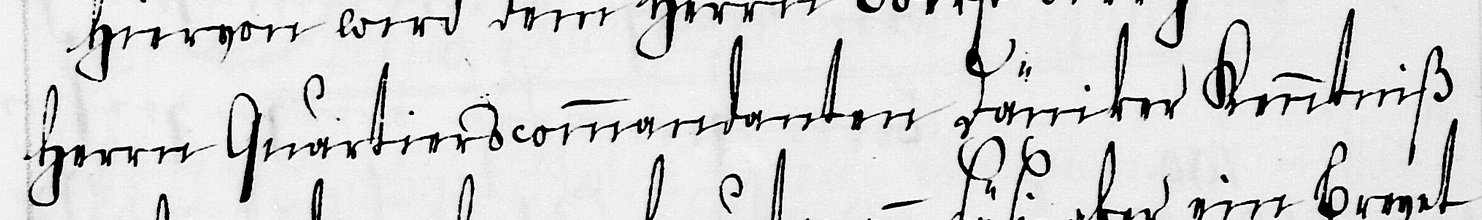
Herrn Quartierscommandanten Däniker Kenntniß
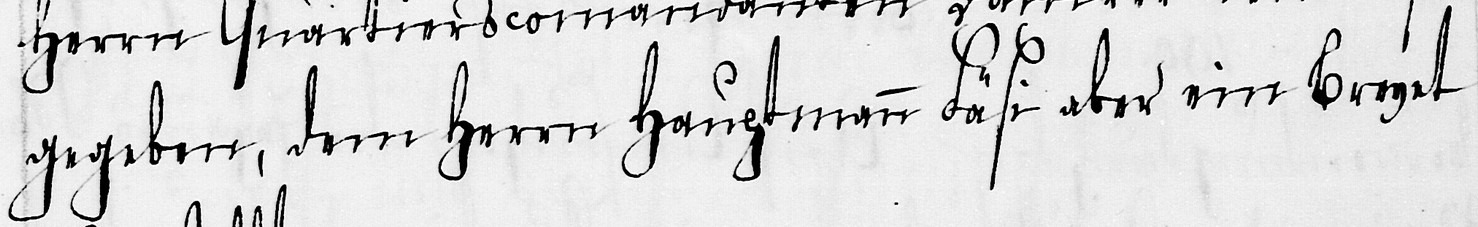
gegeben, dem Herrn Hauptmann Fäsi aber ein Brevet
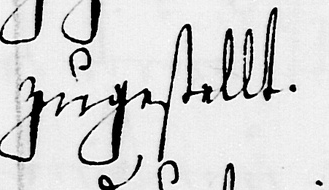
zugestellt.
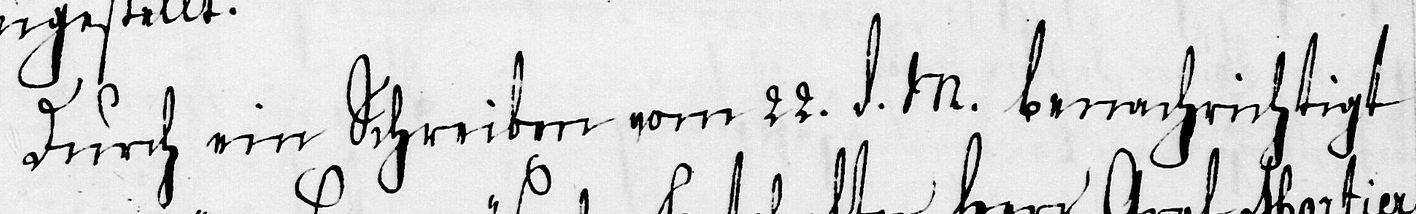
Durch ein Schreiben vom 22. d. M. benachrichtigt
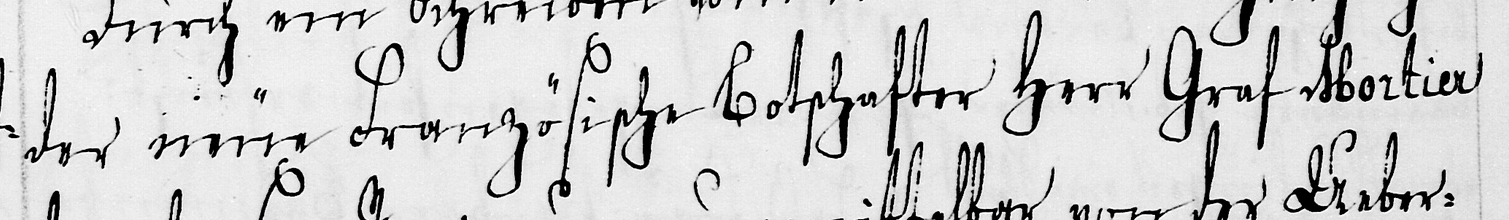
der neue Französische Botschafter Herr Graf Mortier
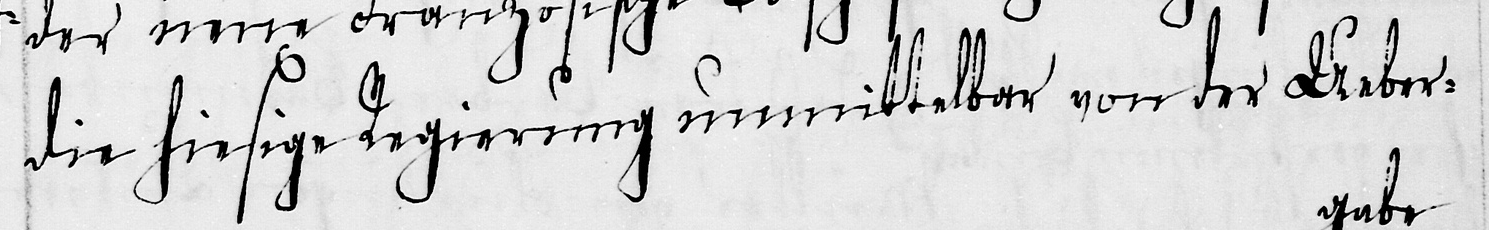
die hiesige Regierung unmittelbar von der Ueber-
